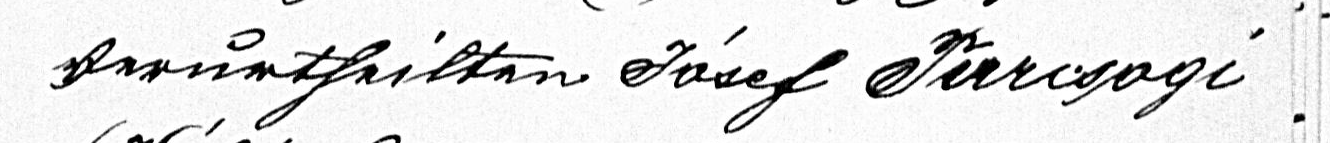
verurtheilten Jósef Tarcsogi
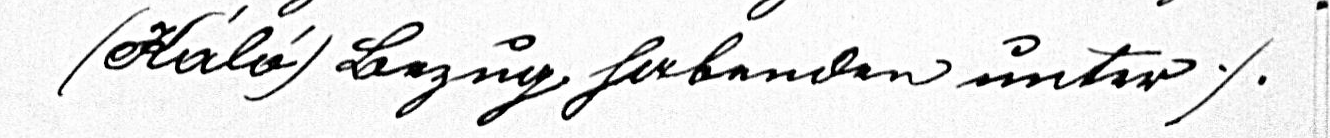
(Káló) Bezug habenden unter ./.
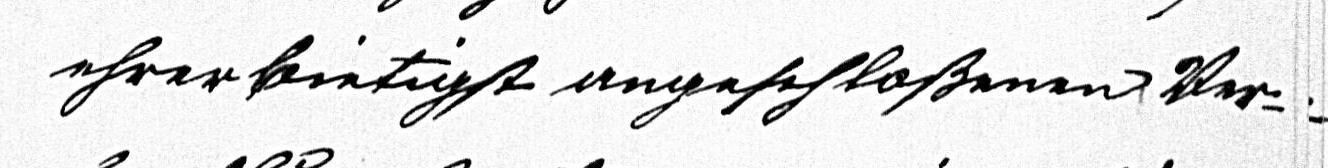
ehrer bietigst angeschloßenen Ver¬
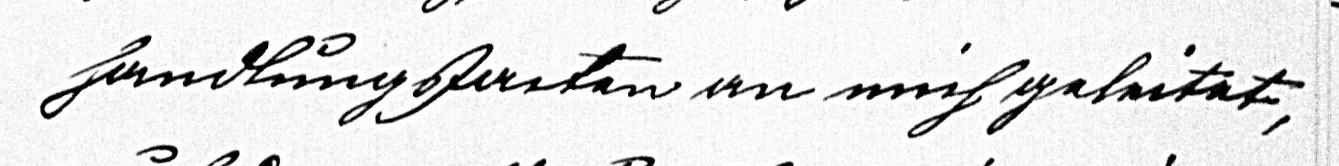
handlungsarten an mich geleitet,
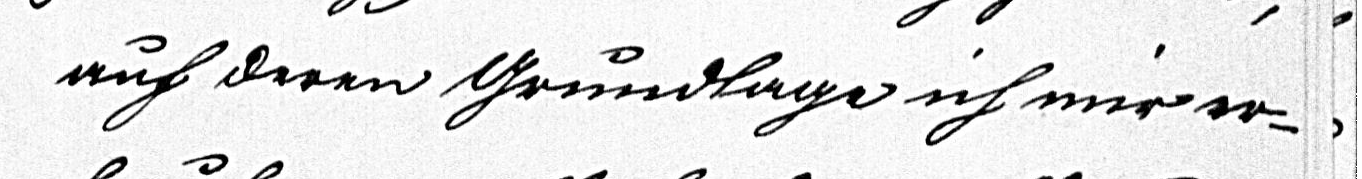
auch deren Grundlage ich mir er¬
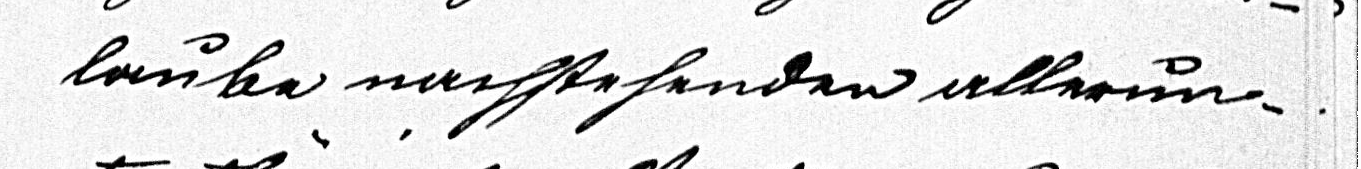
laube nachstehenden allerun¬
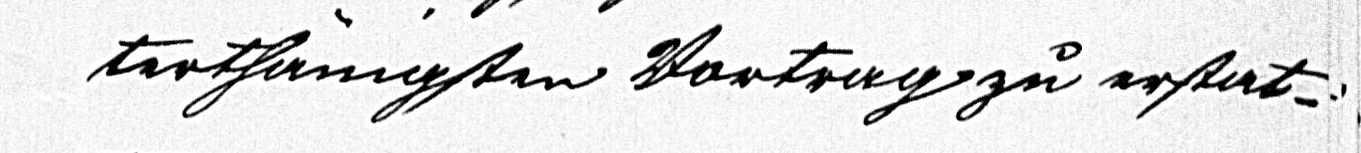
terthänigsten Vortrag zu erstat¬
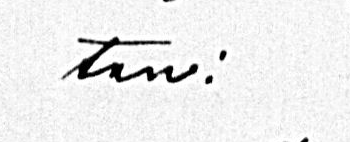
ten:
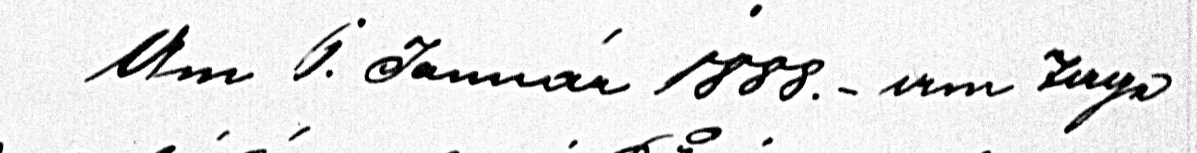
Am 6. Január 1888. - am Tage
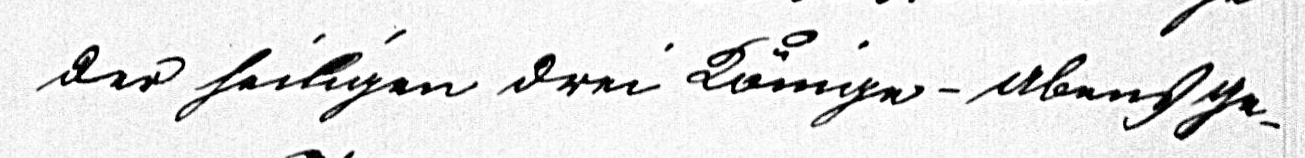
der heiligen drei Könige - Abens ge¬
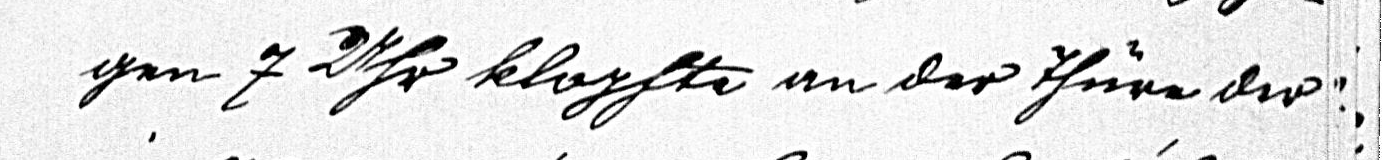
gen 7 Uhr klopfte an der Thüre der
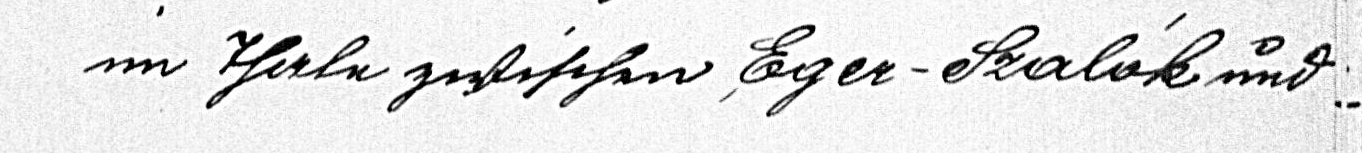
im Thale zwischen, Eger - Szalók und
